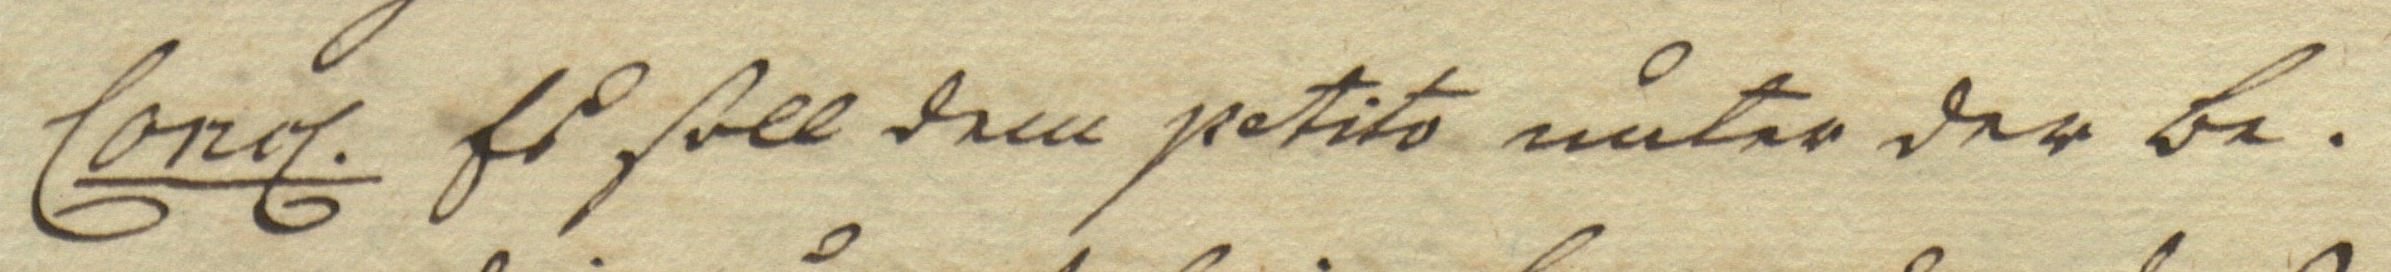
Concl. Es soll dem petito unter der Be¬
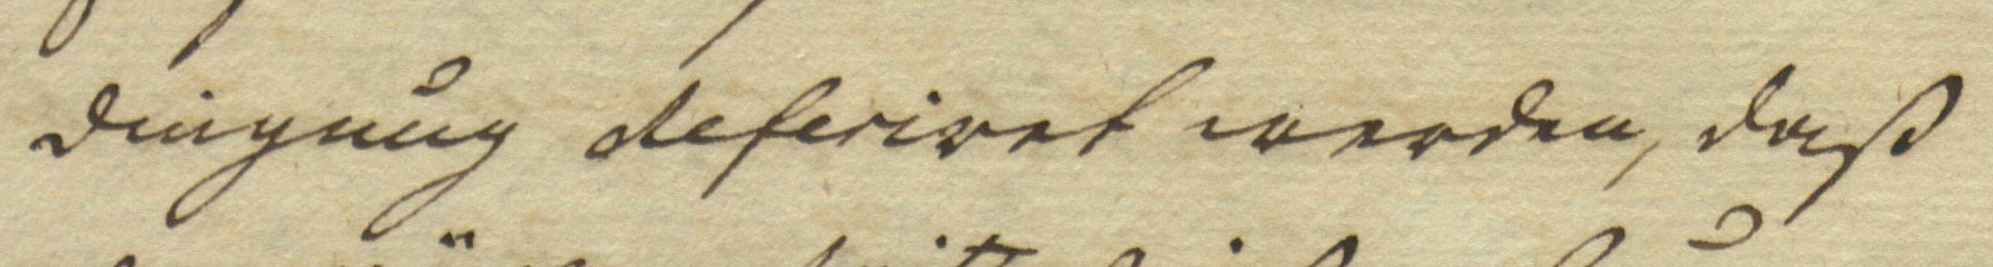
dingung deferiret werden, daß
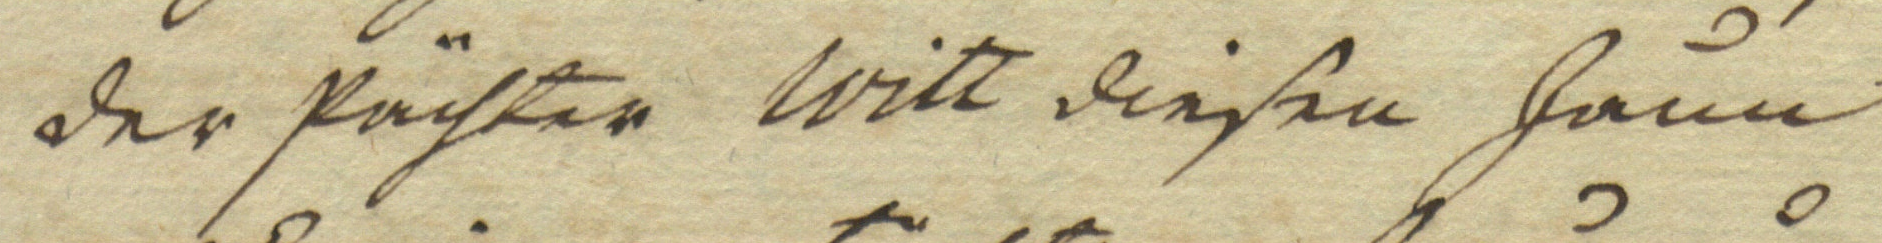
der Pächter Witt diesen Zaun
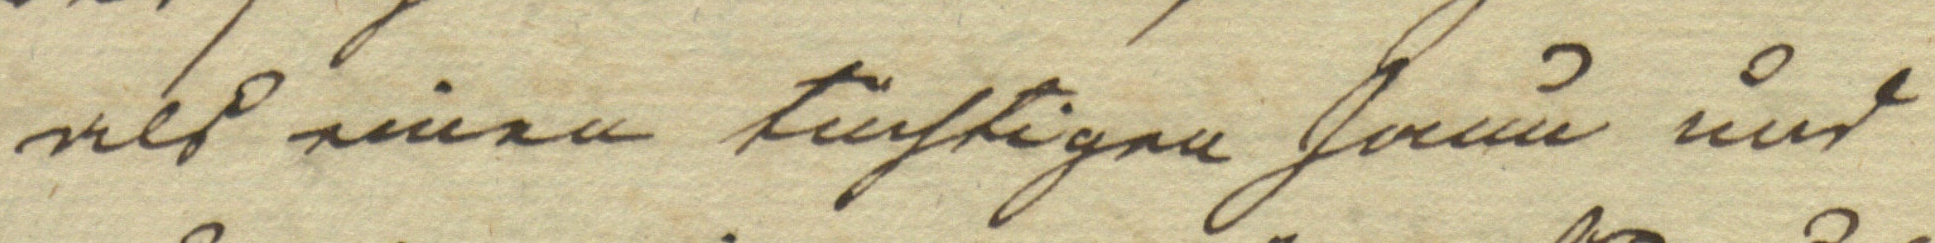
als einen tüchtigen Zaun und
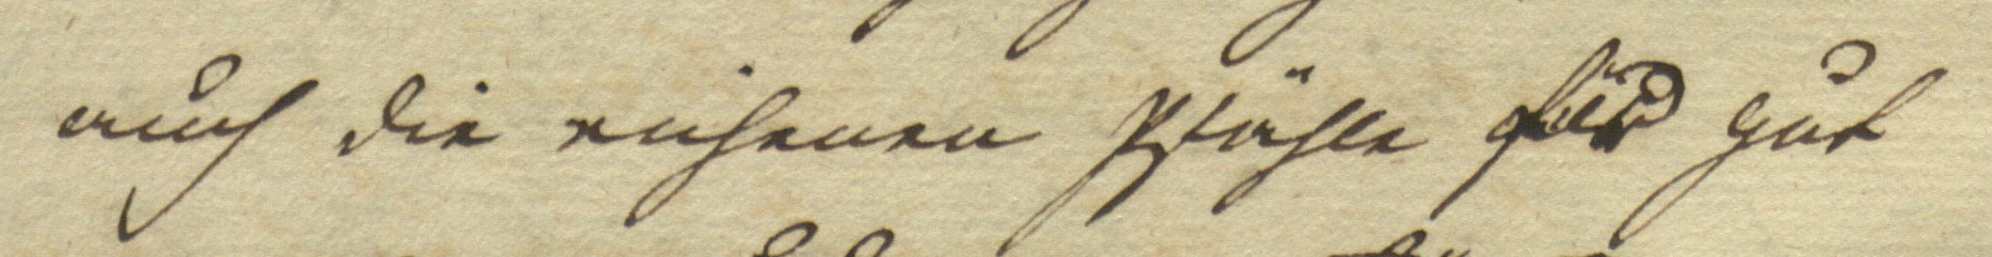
auch die eichenen Pfähle für gut
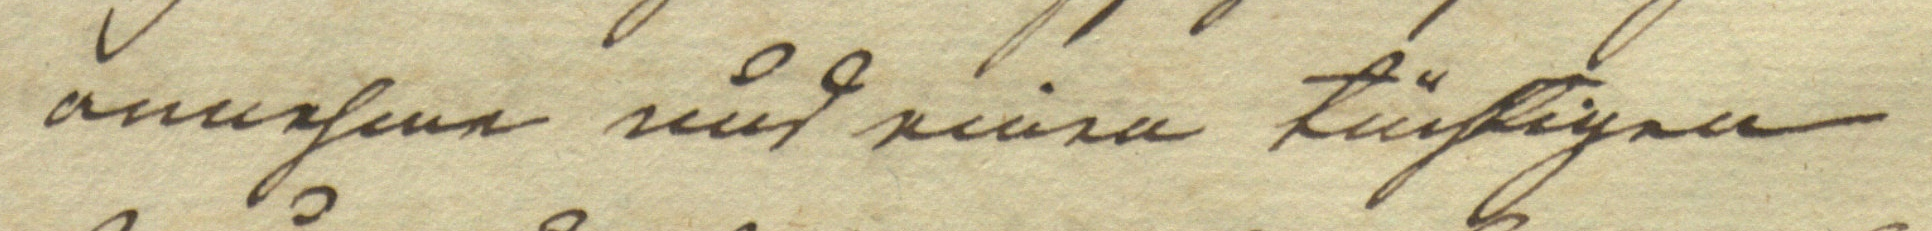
annehmen und einen tüchtigen
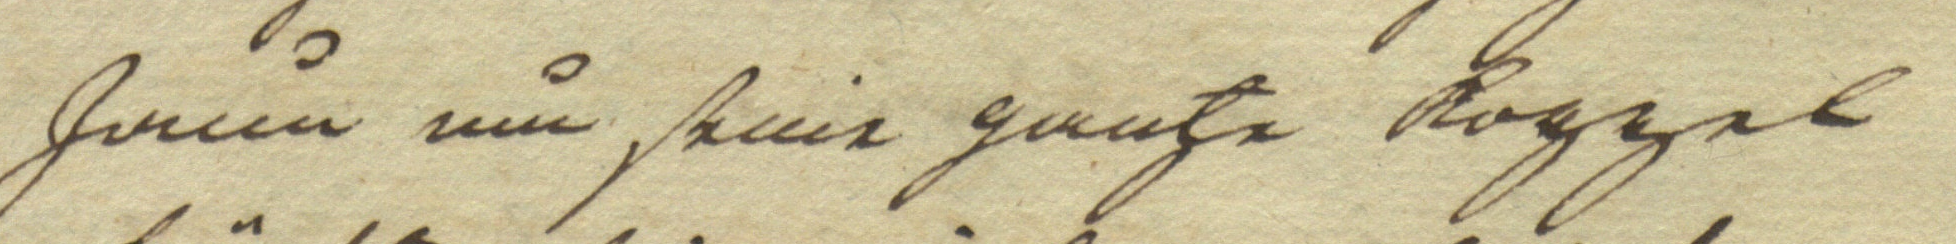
Zaun um seine gantze Koppel
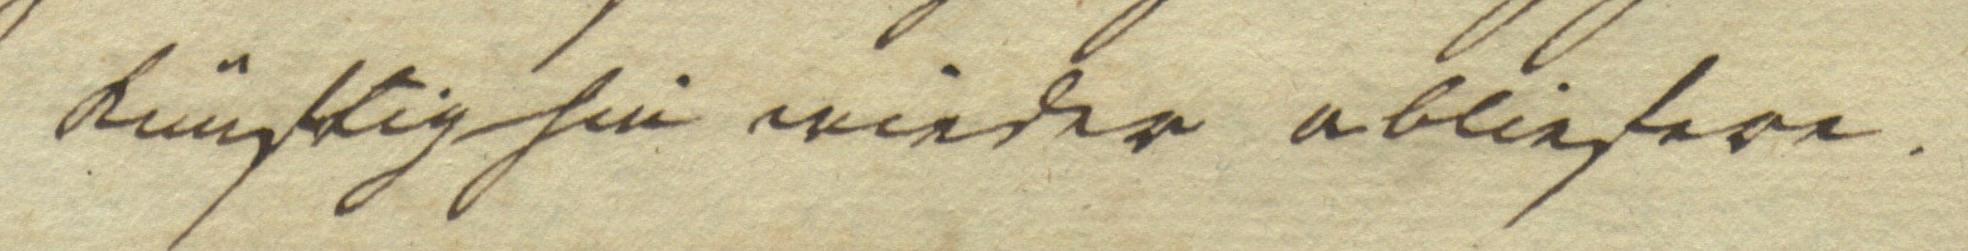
künftighin wieder abliefere.
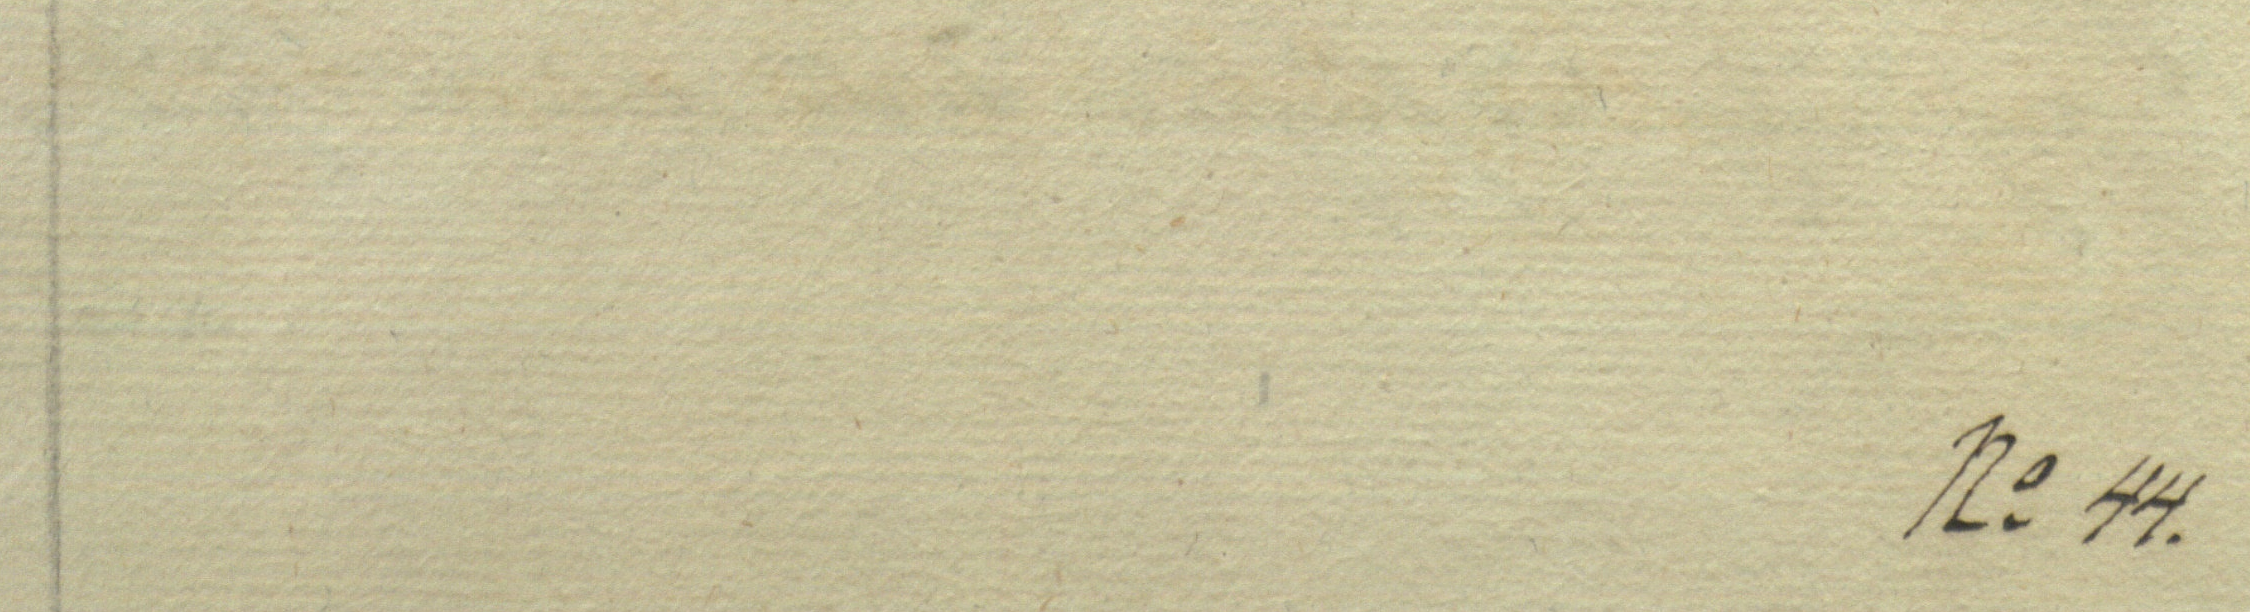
No 44.
